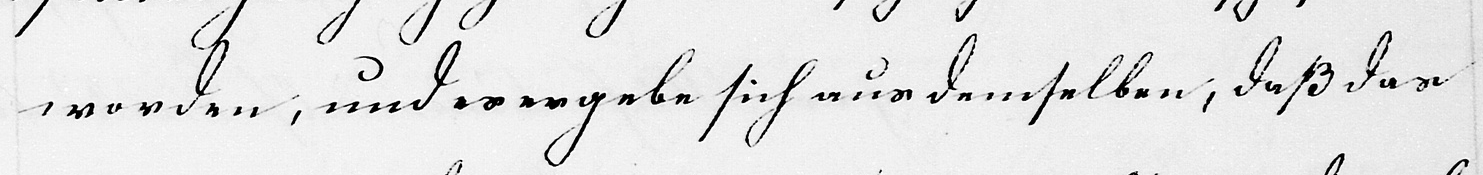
worden, und es ergebe sich aus demselben, daß das
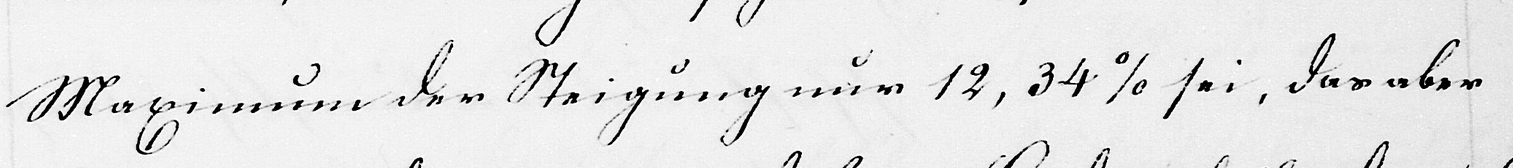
Maximum der Steigung nur 12,34 % sei, das aber
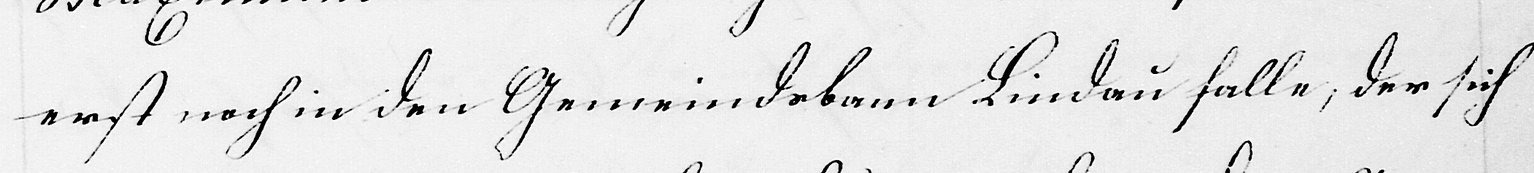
erst noch in den Gemeindsbann Lindau falle, der sich
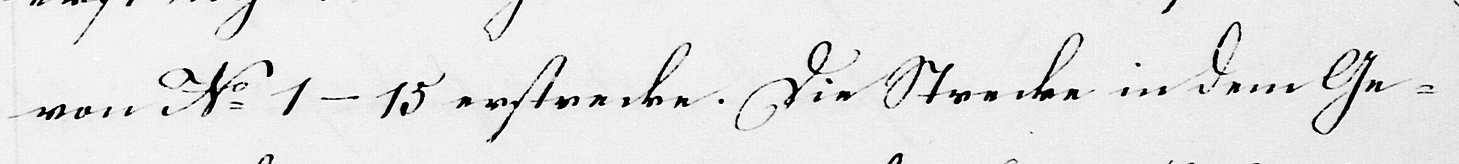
von No 1−15 erstrecke. Die Strecke in dem Ge¬
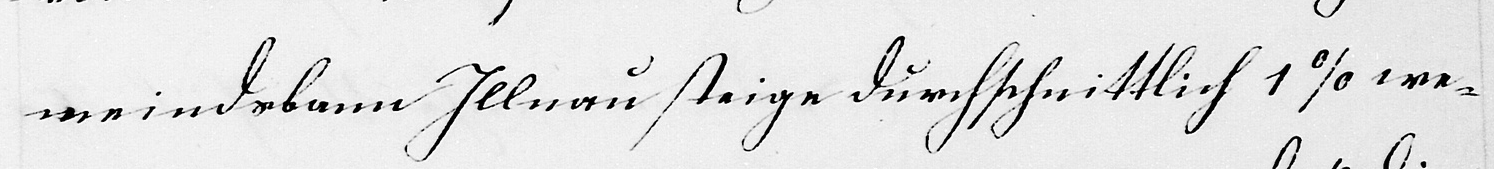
meindsbann Illnau steige durchschnittlich 1 % we¬
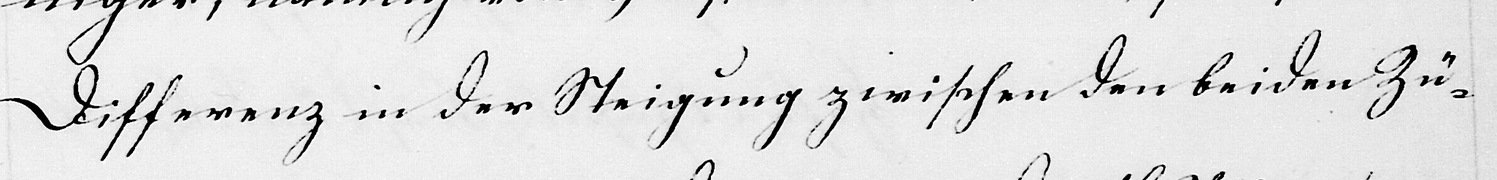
Differenz in der Steigung zwischen den beiden Zü¬
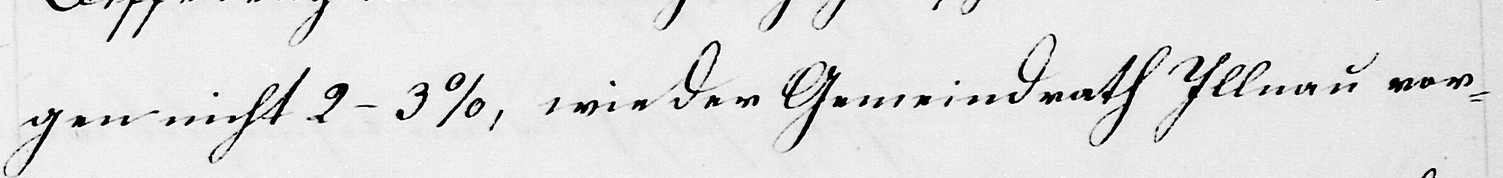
gen nicht 2−3 %, wie der Gemeindrath Illnau vor¬
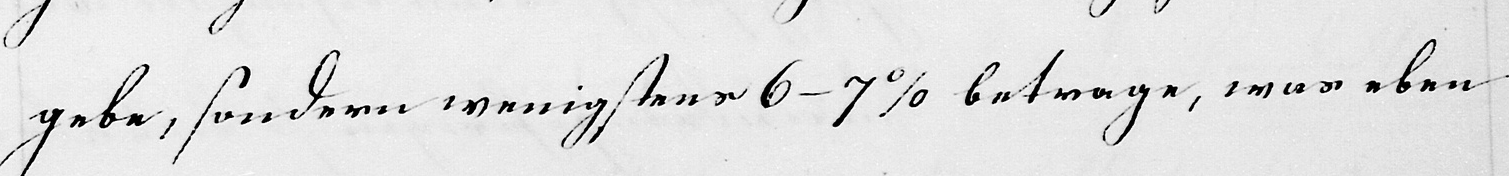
gebe, sondern wenigstens 6−7 % betrage, was eben
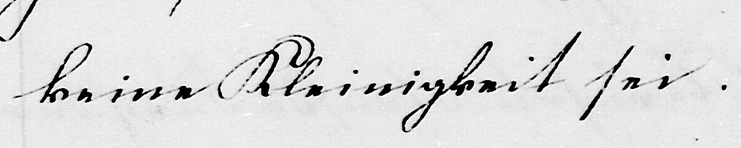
keine Kleinigkeit sei.
